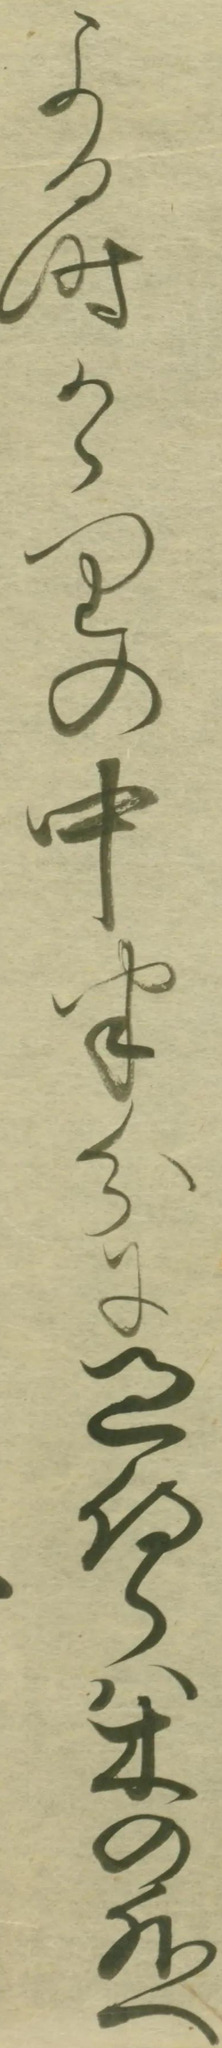よる時かゝりの中半分に過侍らは木の外へ
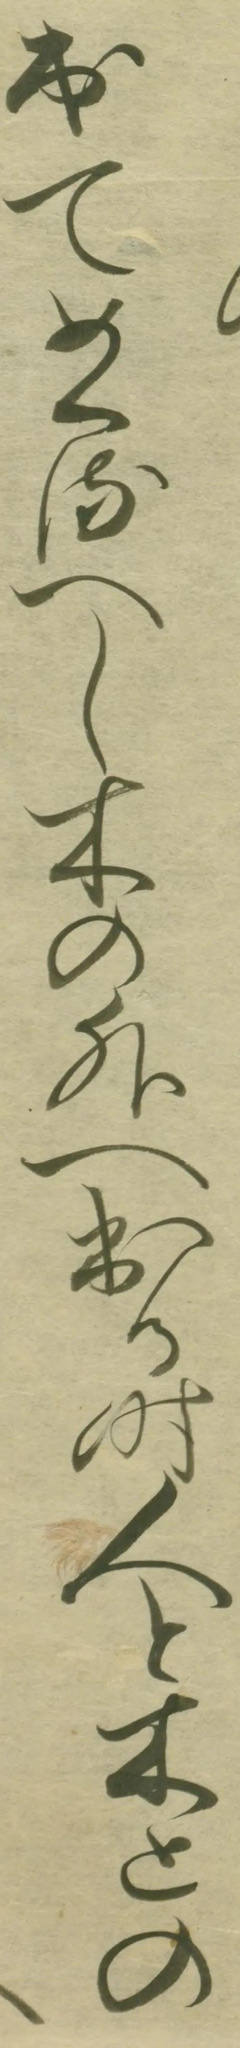出てめくるへし木の外へ出る時人と木との
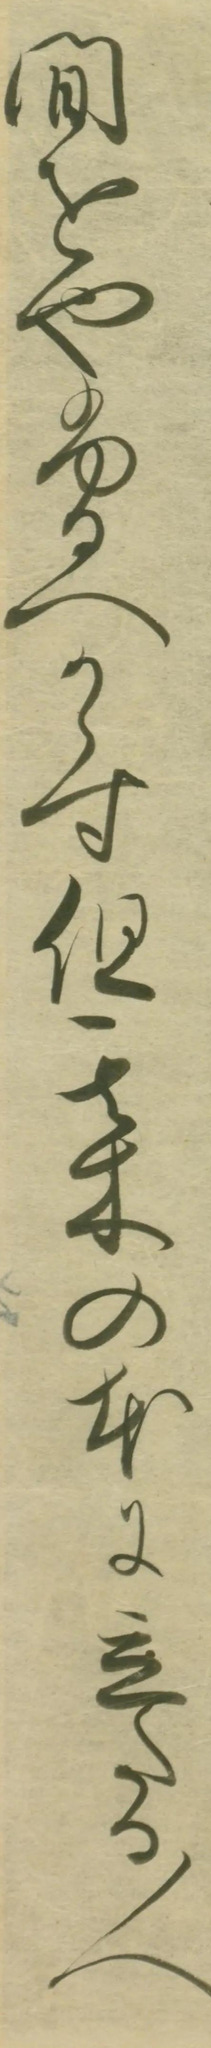間をやふるへからす但其木の本に立たる人
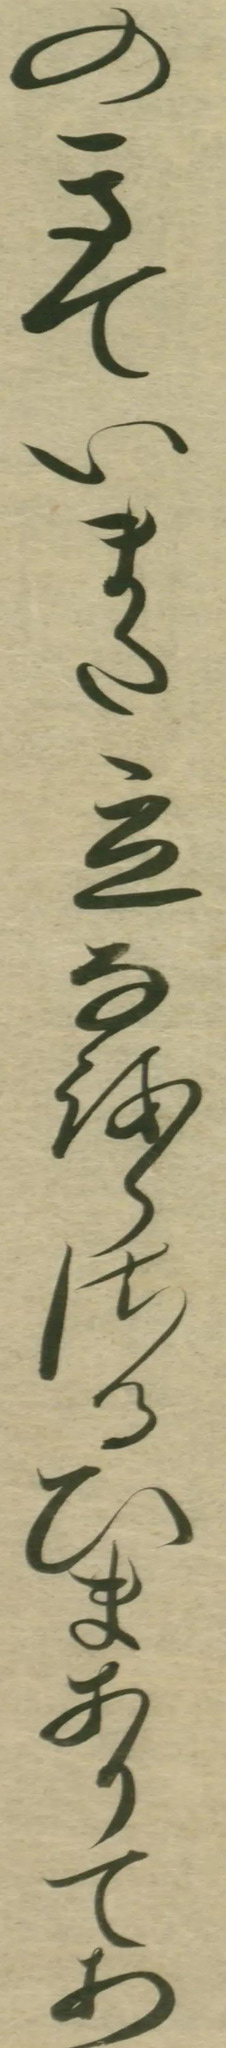のきていまた立なをらさるひまありてあ

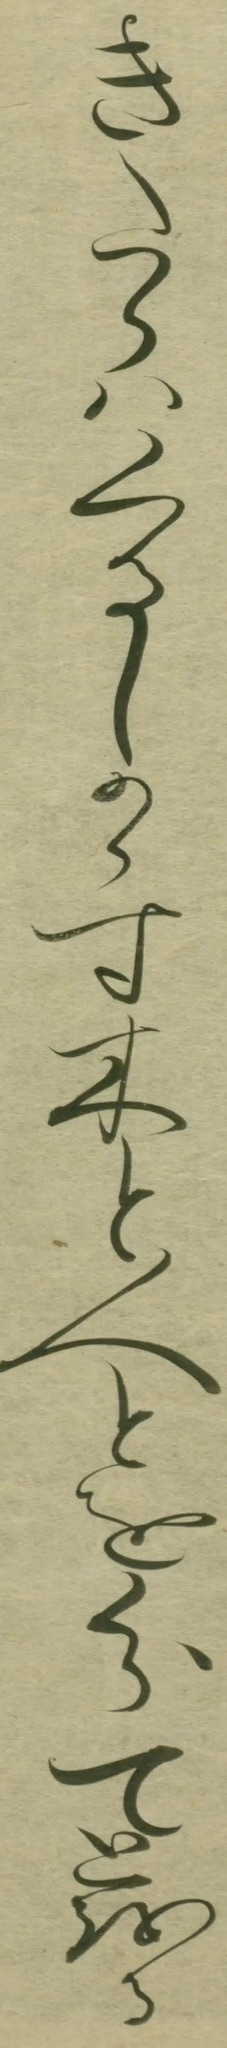きたらはくるしからす木と人とを分てとをる
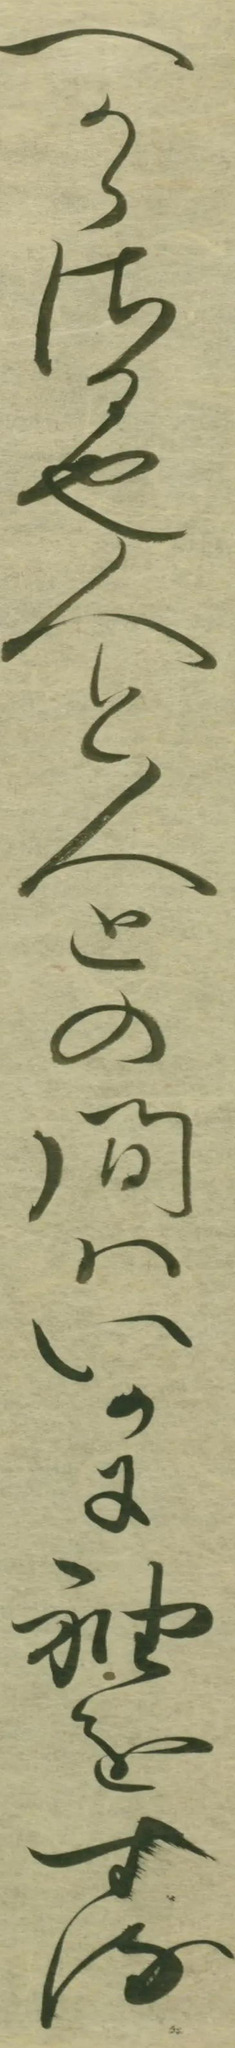へからさる也人と人との間はいかに袖をする
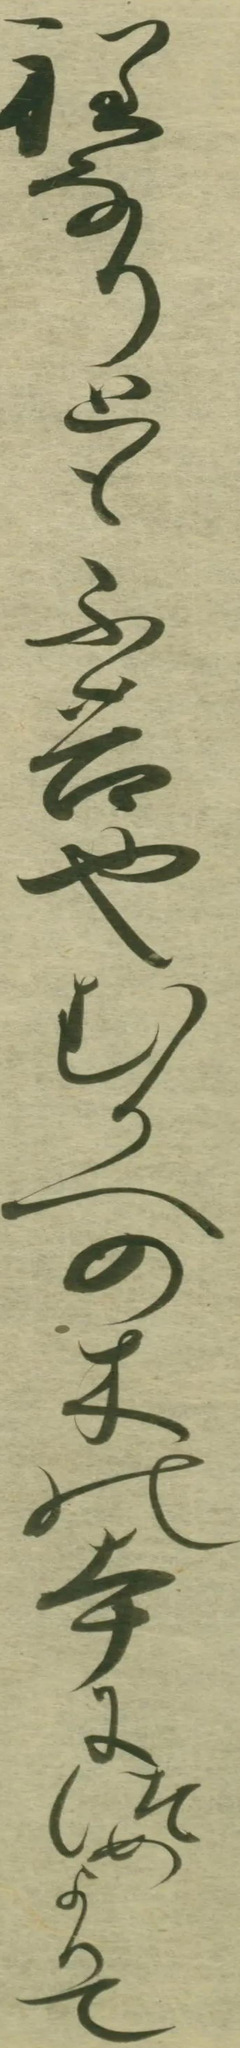程なりとも不苦也むかへの木の本につめよりて
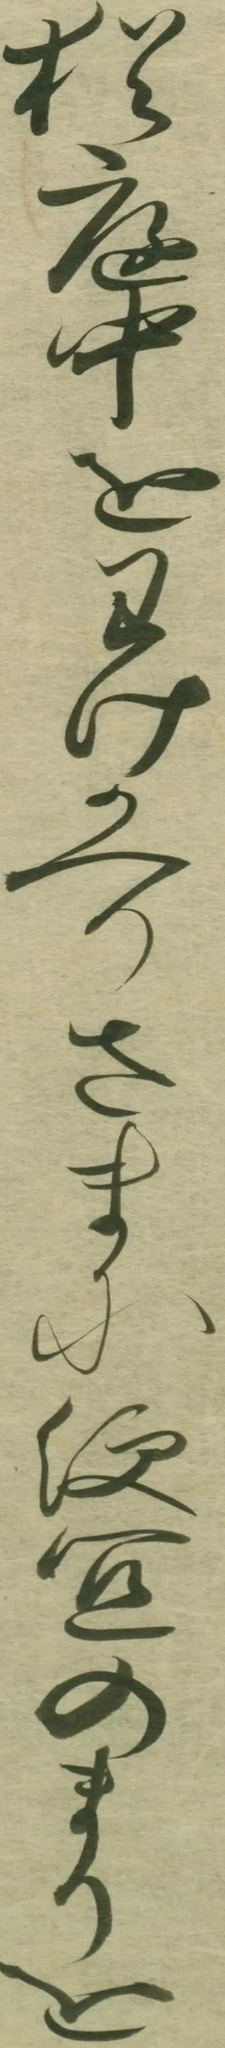猶庭中をわけかへりさまに便宜のまりを
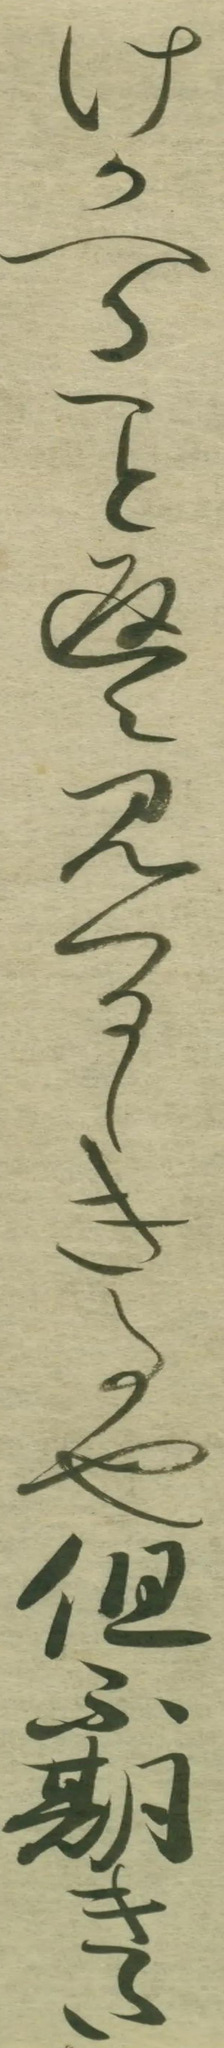けかへること返々みくるしき事也但不期きた
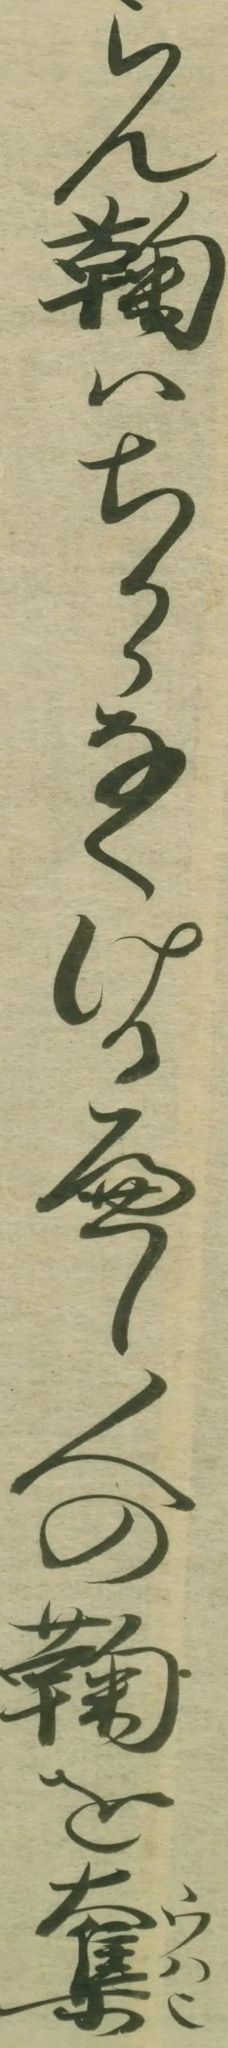らん鞠はちからなくけるへし人の鞠を奪
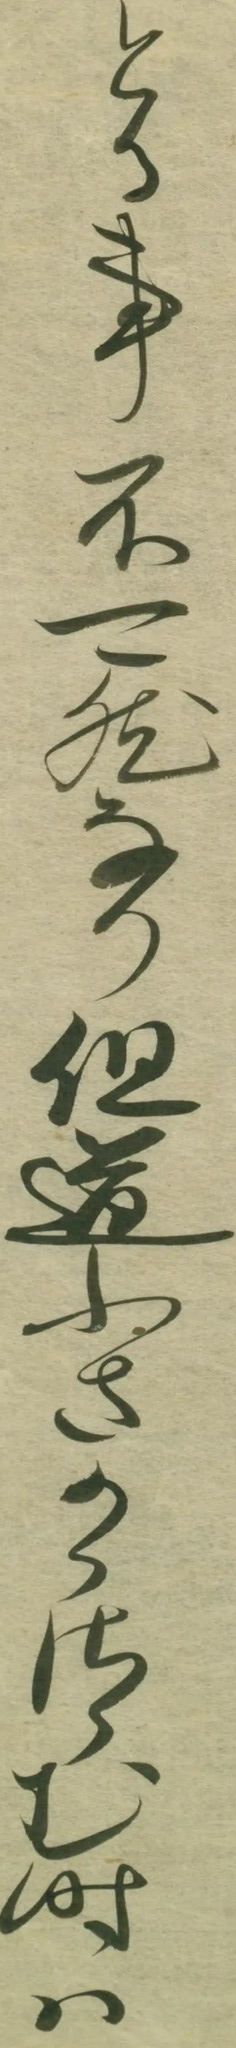とる事不可然なり但道ふさからさらむ時は
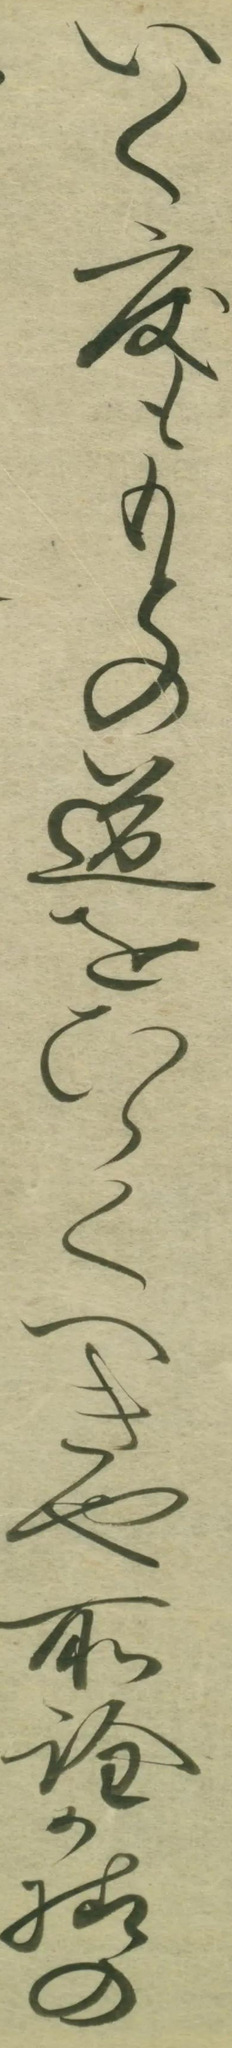いく度ももとの道をひらくへき也所詮か様の
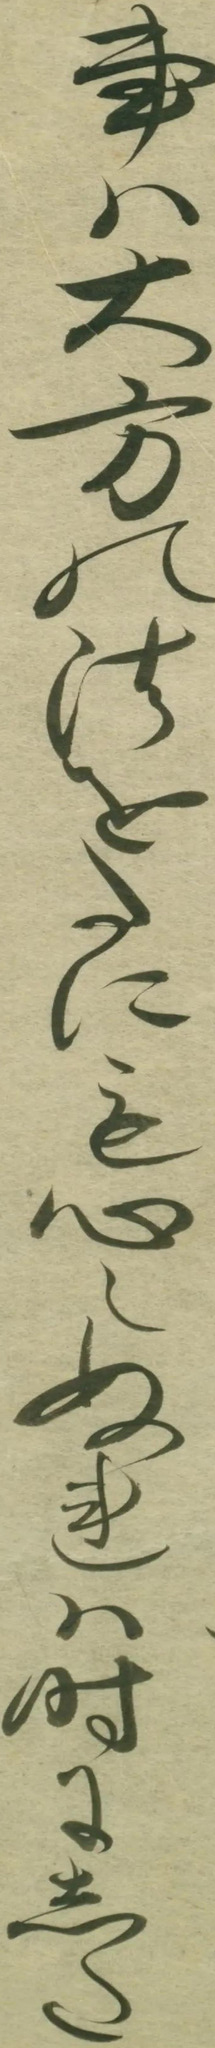事は大方の法をたにも心しぬれは時にした
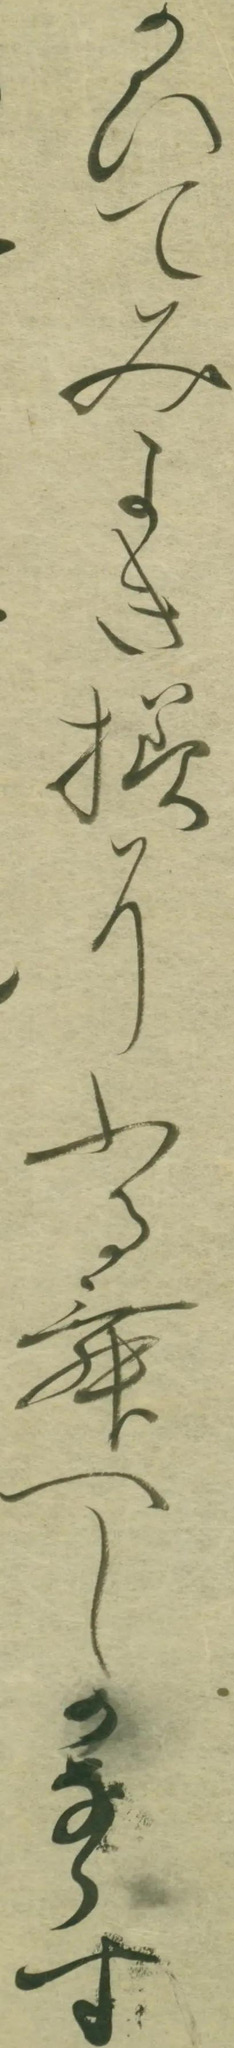かひてみよき様にふる舞へしかならす
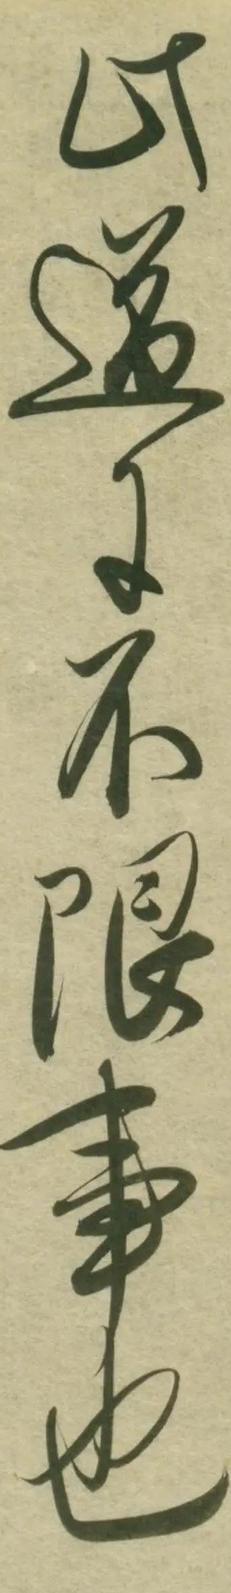此道に不限事也
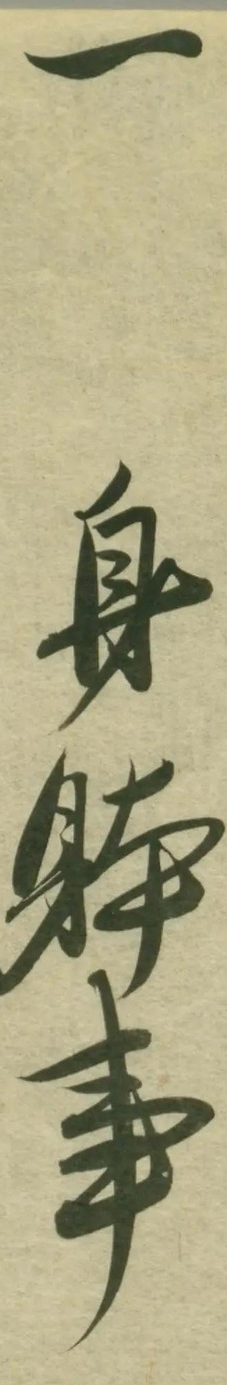一身体事
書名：蹴鞠之条々大概
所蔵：国立国会図書館 National Diet Library, JAPAN
